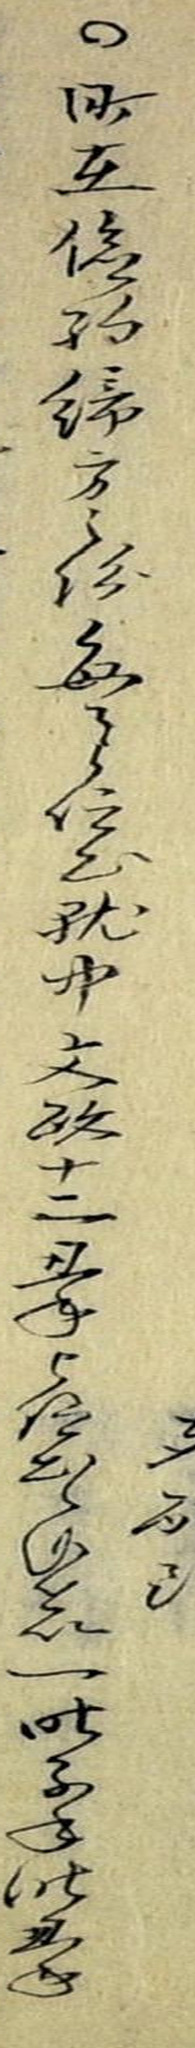○町在倹約方之儀毎々被仰出就中文政十二丑年被仰出候趣を以一昨子年昨丑年
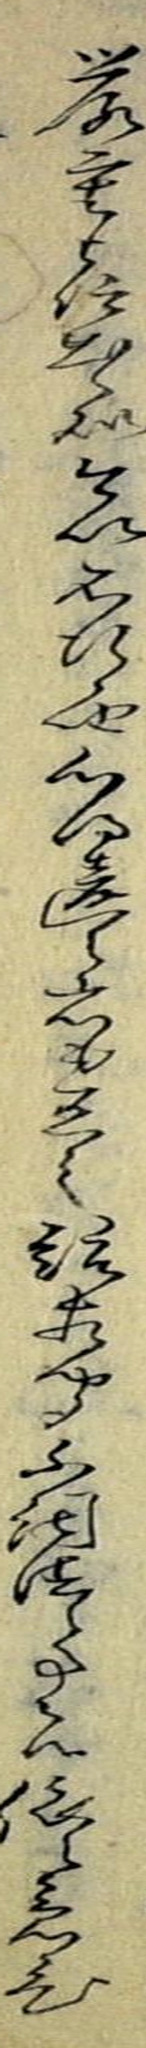厳重被仰出候処不行届心得違之者も有之趣相聞不調法之事に候依之急度
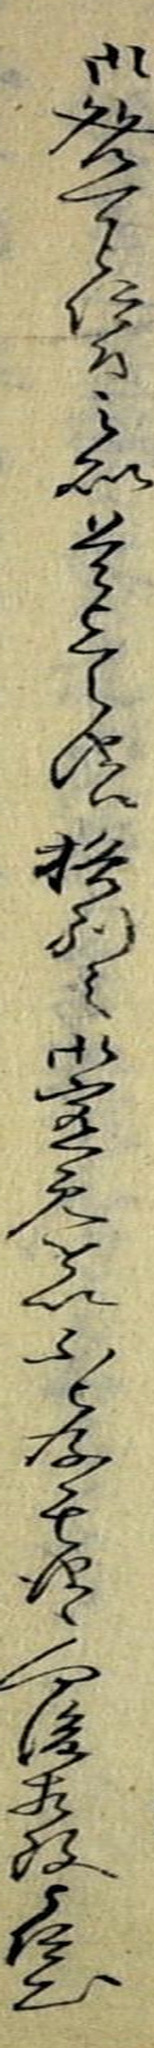御咎可被仰付之処是迄之儀は各別之御宥免を以不被及其儀侯向後相改被仰出
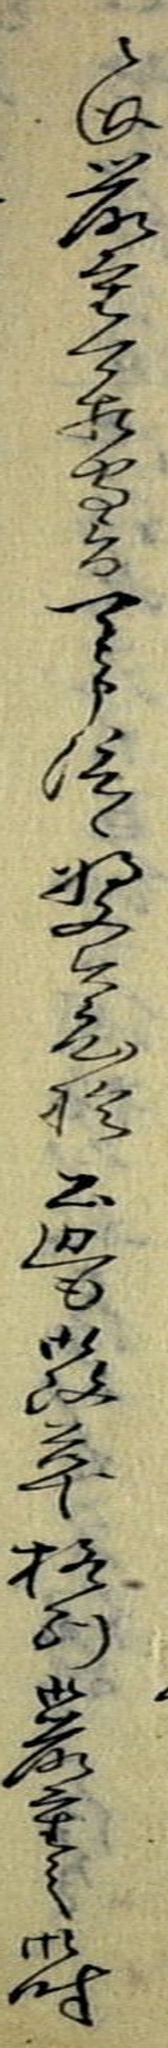候趣厳重可相守旨可被申渡候猶又今度於公辺も御改革格別御厳重之御時
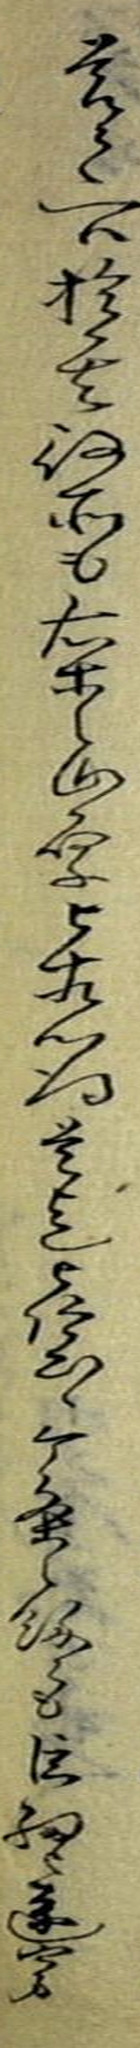節に候へは於其役所も右等之趣厚相心得是迄被仰出候ヶ条之趣も巨細に遂穿
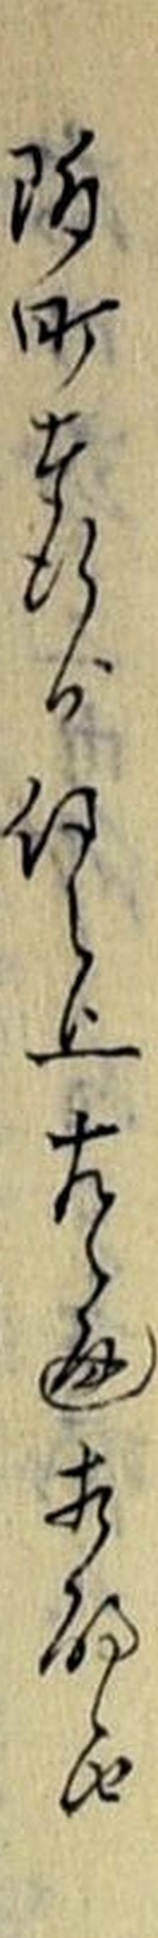附町奉行ゟ伺之上左之通相触れ候由
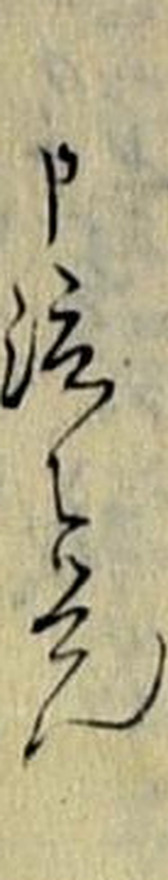申渡之覚
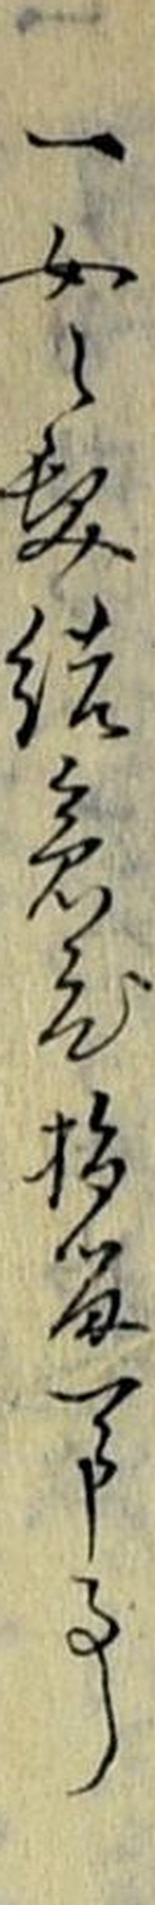一女之髪結急度指留可申事
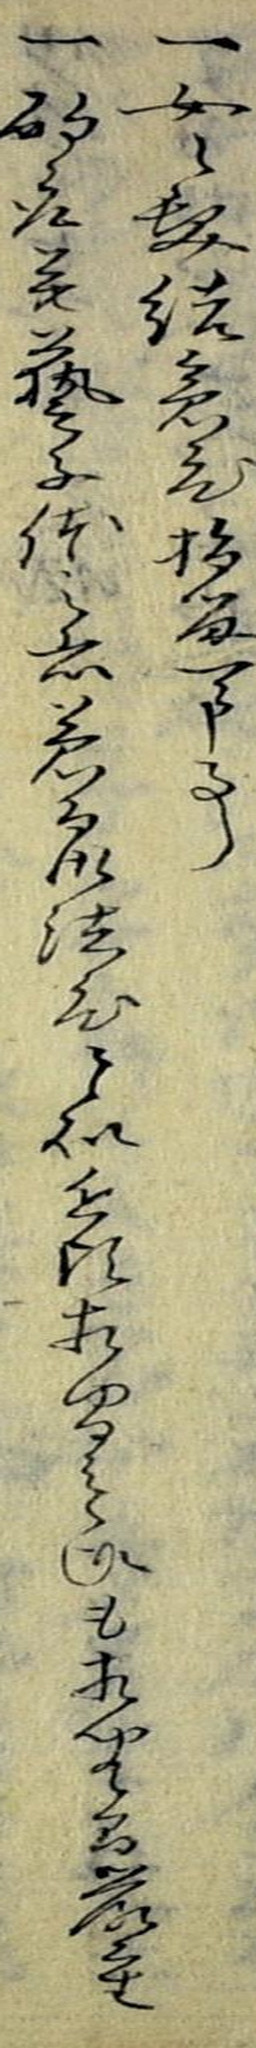一酌取并芸子体之者兼而御法度に候処近頃相ゆるみ候趣も相聞候間厳重
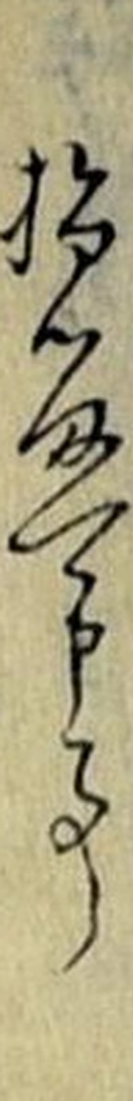指留可申事
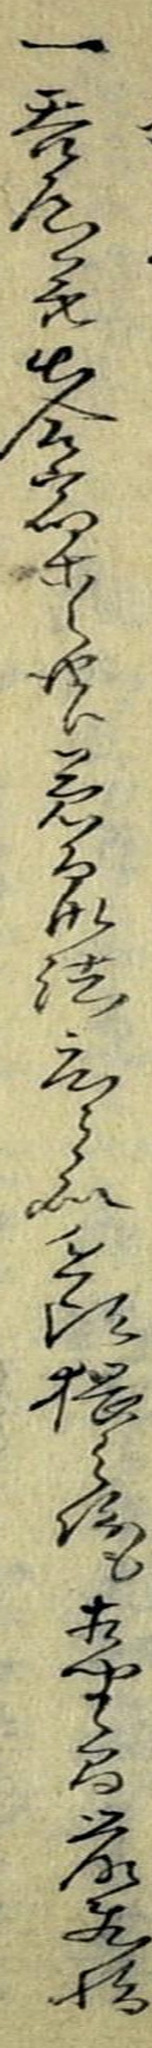一呑屋并出合宿等之儀は兼而御法度に候処近頃猥り之儀も相聞候間厳敷指
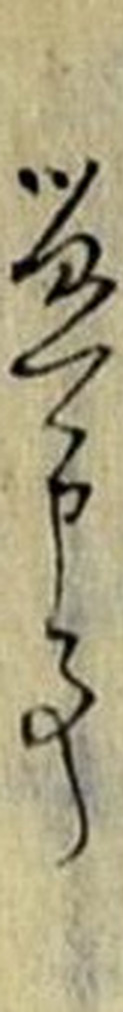留可申事
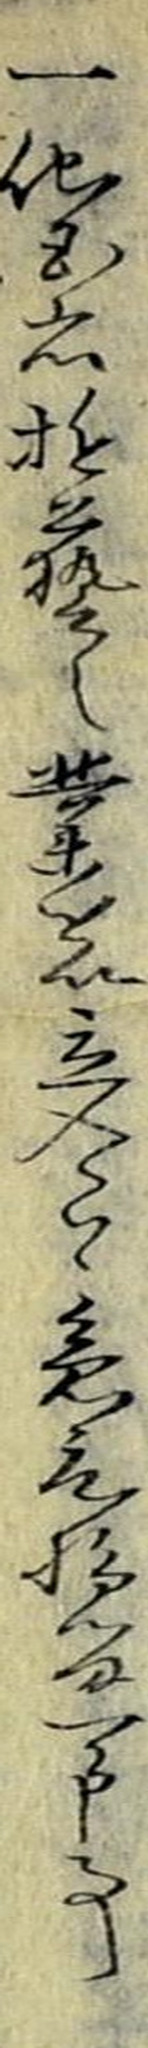一他国者遊芸之業を以立入候はヽ急度指留可申事
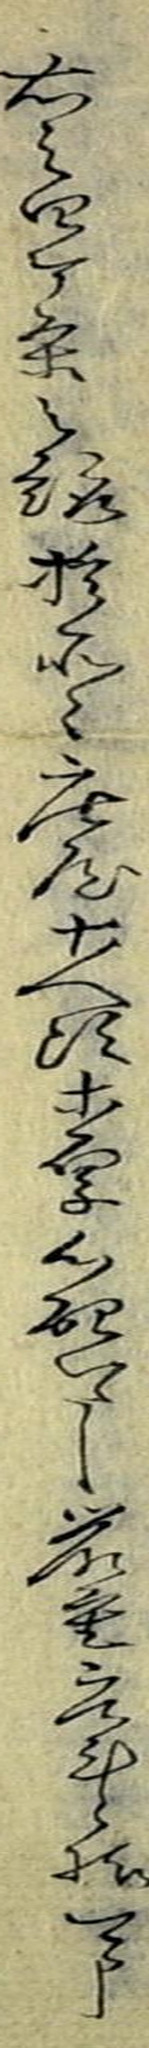右之四ヶ条之趣於所々庄屋十人頭等厚心配いたし厳重取斗候様可申
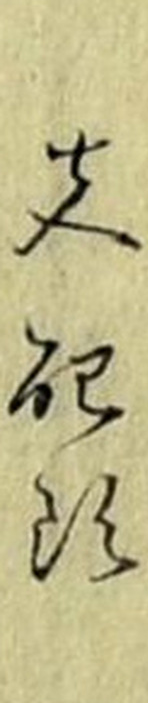支配頭
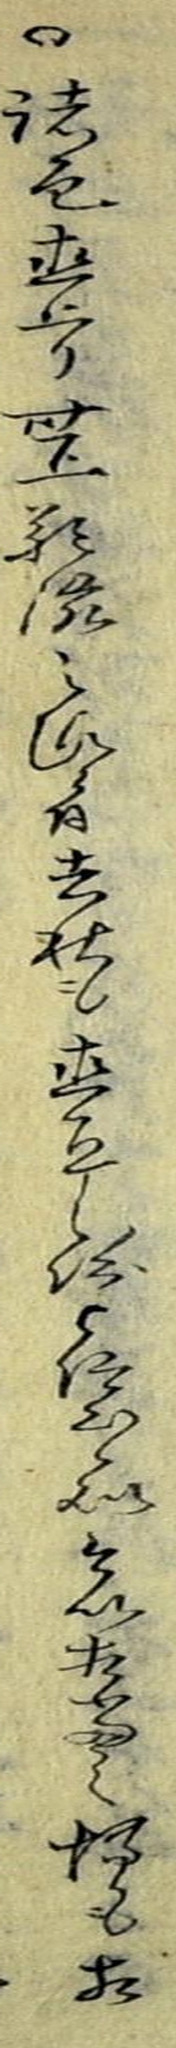○諸色直上り世上難渋之趣に付去秋も直下ヶ之儀被仰出候処今以相当之場へも相
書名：命令之部 六
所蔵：福井県文書館 Fukui Prefectural Archives
